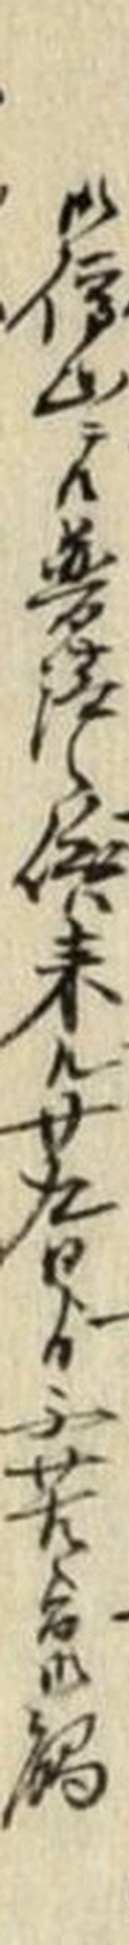御停止に候普請之儀は来ル廿九日ゟ不苦旨御触
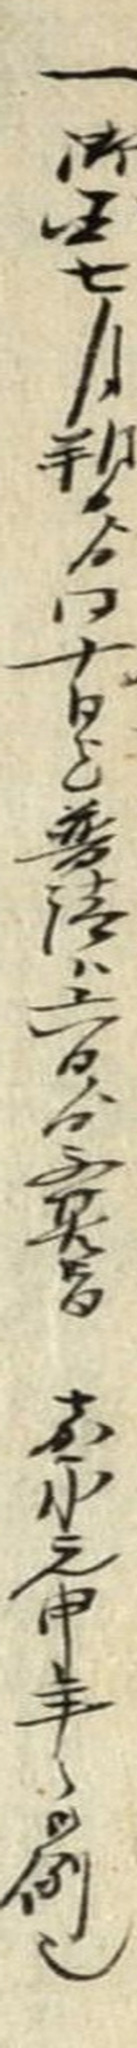一御国七月朔日ゟ同十日迄普請は六日ゟ不苦旨嘉永元申年之御例也

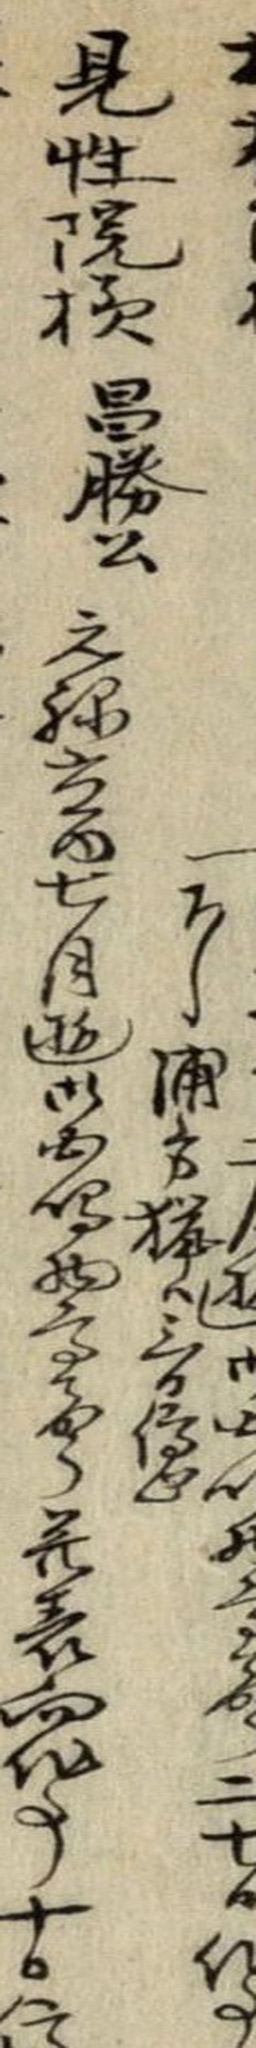一見性院様昌勝公元禄六酉七月逝御国鳴物高声并表向作事十日停止
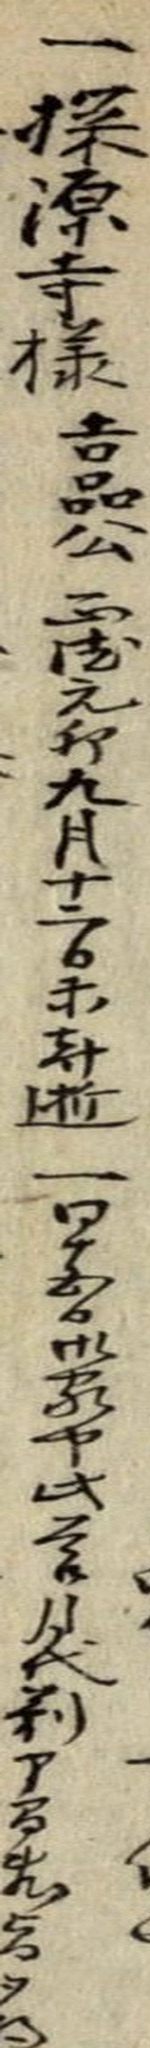一探源寺様吉品公正徳元卯九月十二日未刻逝一同十五日御家中此節月代剃申間敷旨御触
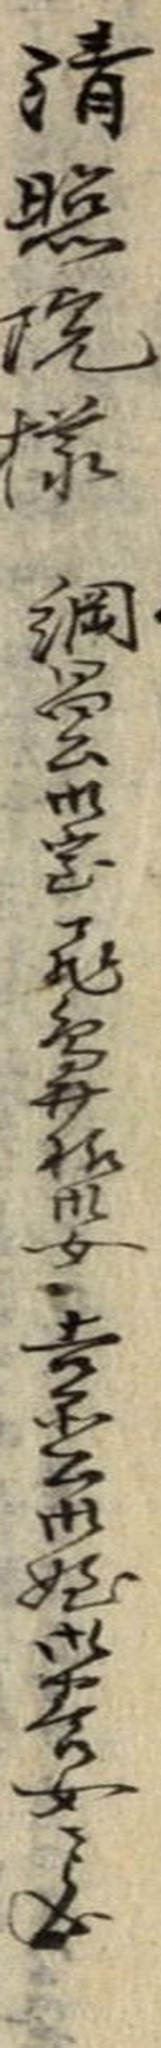一清照院様綱昌公御室飛鳥井様御女吉品公御姫御養女に被成
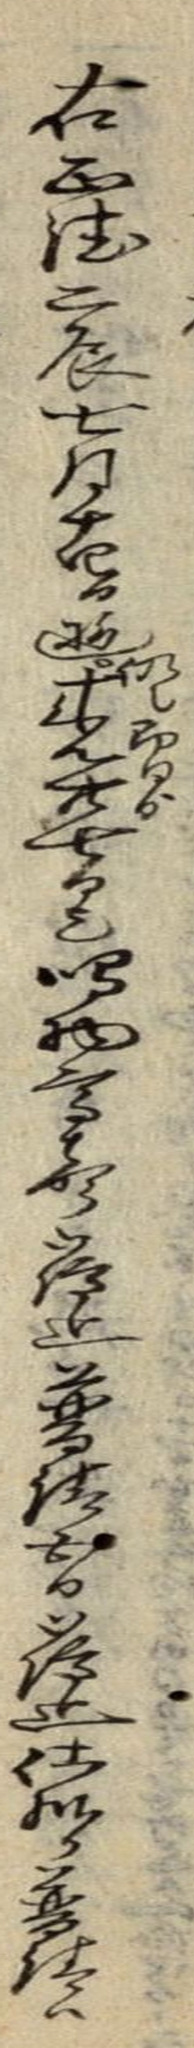右正徳二辰七月十四日逝◦仍之即日ゟ来ル廿七日迄鳴物高声御停止普請五日御停止仕掛り普請は
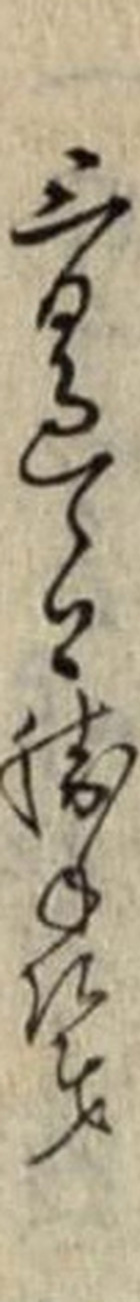三日過候はゝ勝手次第
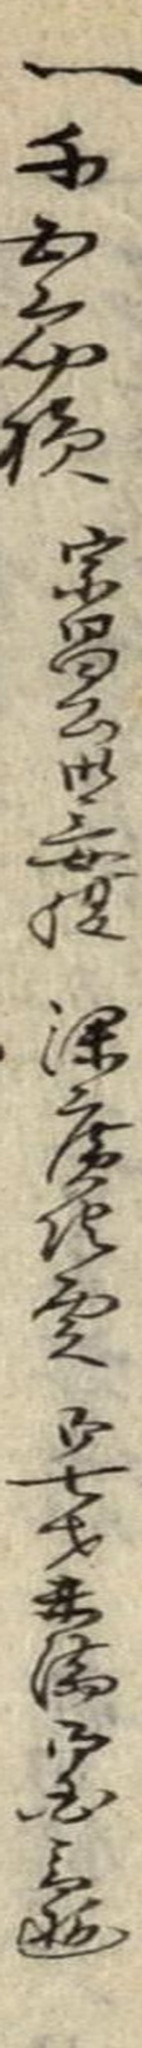一千五郎様宗昌公御妾腹深広院殿御七才未満御国にて逝
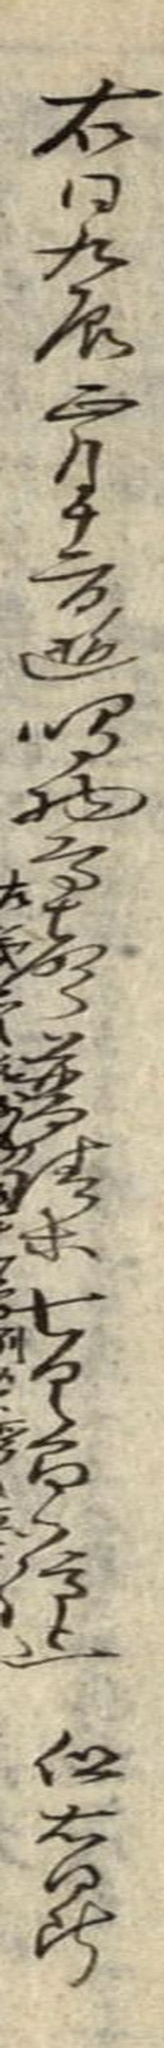右同九辰正月十二日逝鳴物高声普請等七日之間御停止但右同断
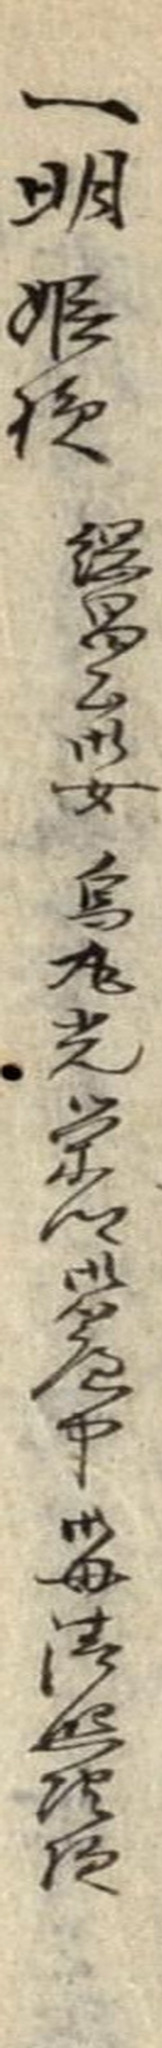一明姫様綱昌公御女烏丸光栄卿御簾中御母清照院様
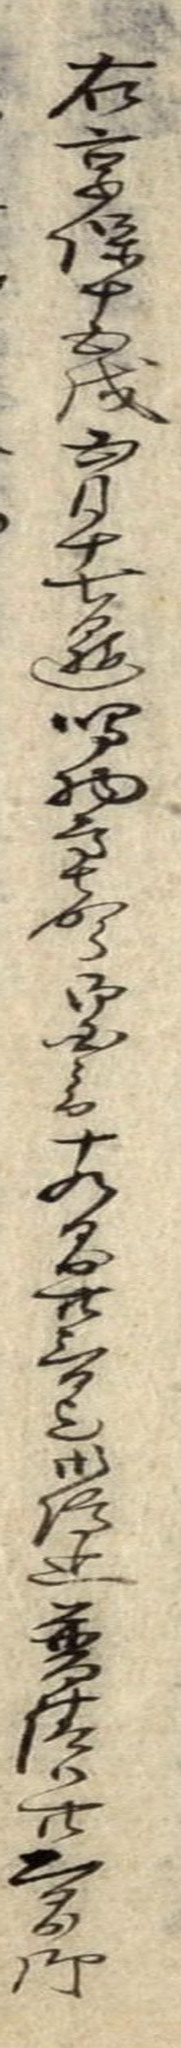右享保十五戌五月十七日逝鳴物高声御国にて十九日ゟ廿三日迄御停止普請は廿二日ゟ御
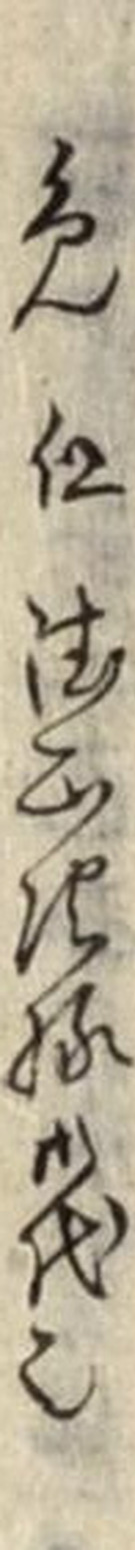免但徳正院様御代也
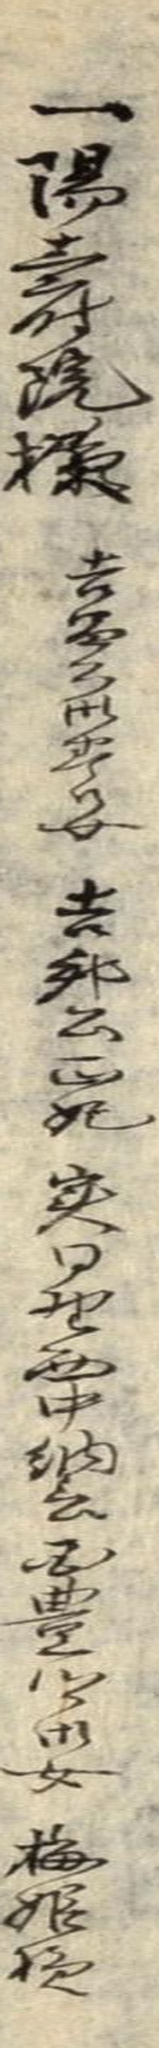一陽寿院様吉品公御養女吉邦公正妃実日野西中納言国豊卿御女梅姫様
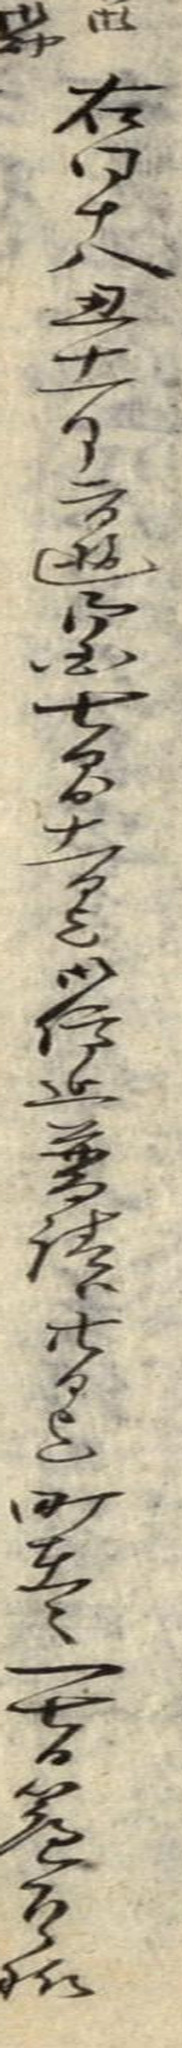右同十八丑十一月二日逝御国七日ゟ十一日迄御停止普請は廿日迄町在々一七日簾下候様
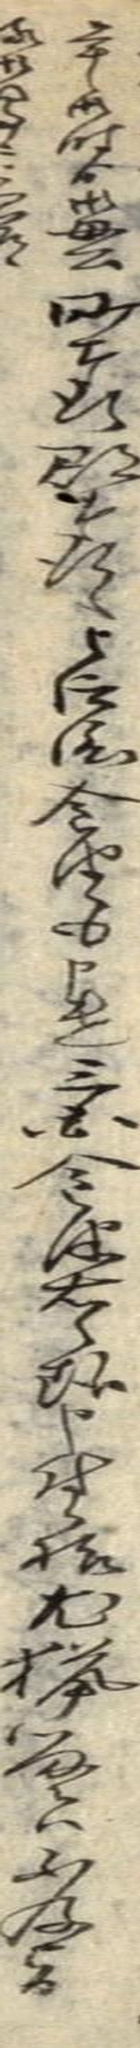町奉行郡奉行へ被仰渡金津へも申遣三国金津右之趣申付候様尤猟留には不及旨

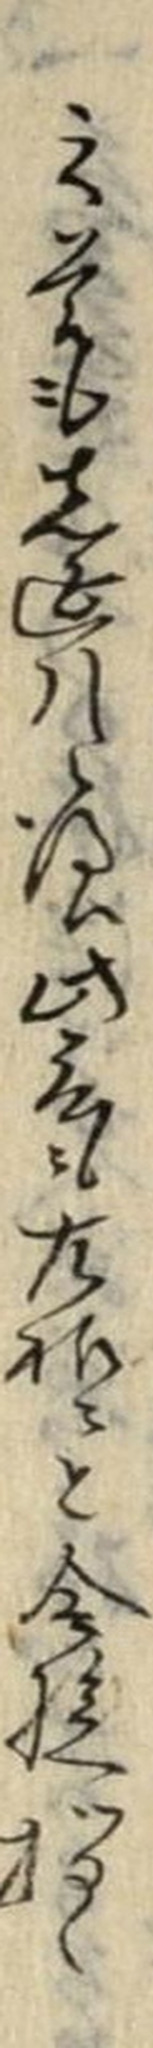之節も先延引候得は此度も左様にと令挨拶候
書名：御停止異変死失
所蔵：福井県文書館 Fukui Prefectural Archives
